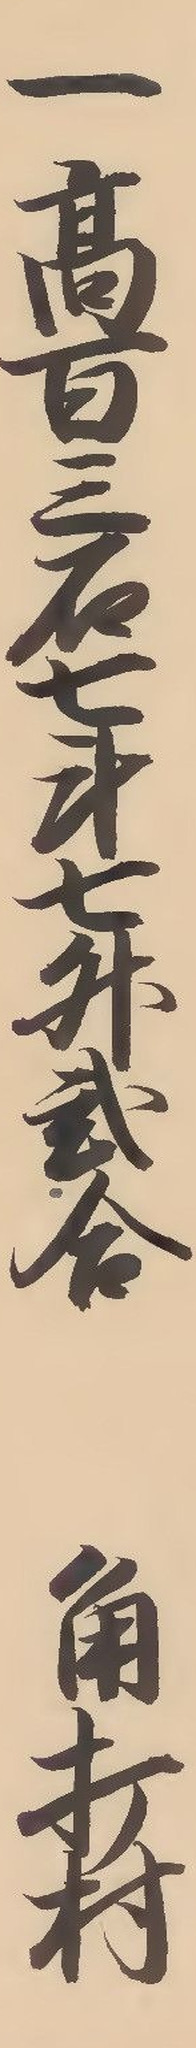一高百三石七斗七升弐合角打村

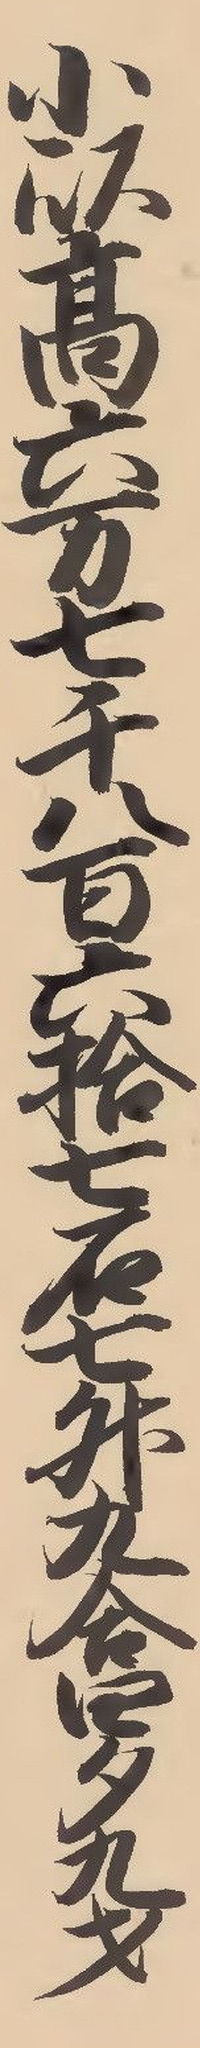小以高六万七千八百六拾七石七升九合四勺九才
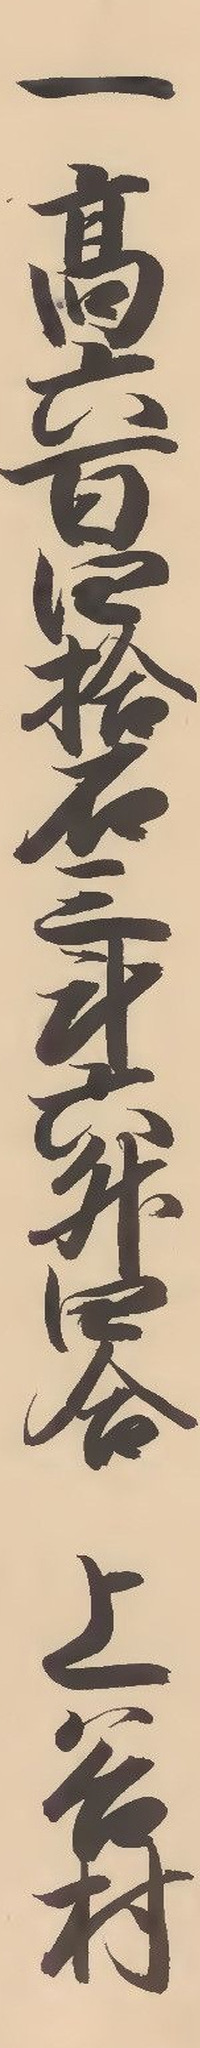一高六百四拾石三斗六升四合上谷村
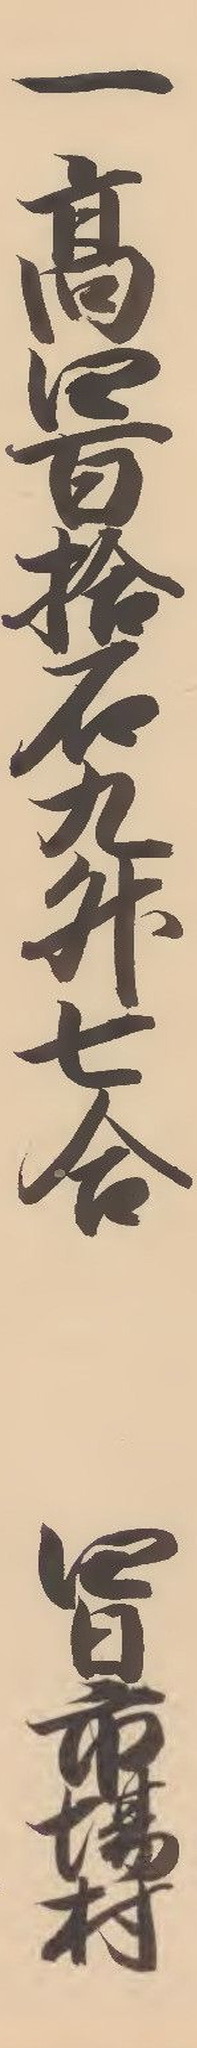一高四百拾石九升七合四日市場村

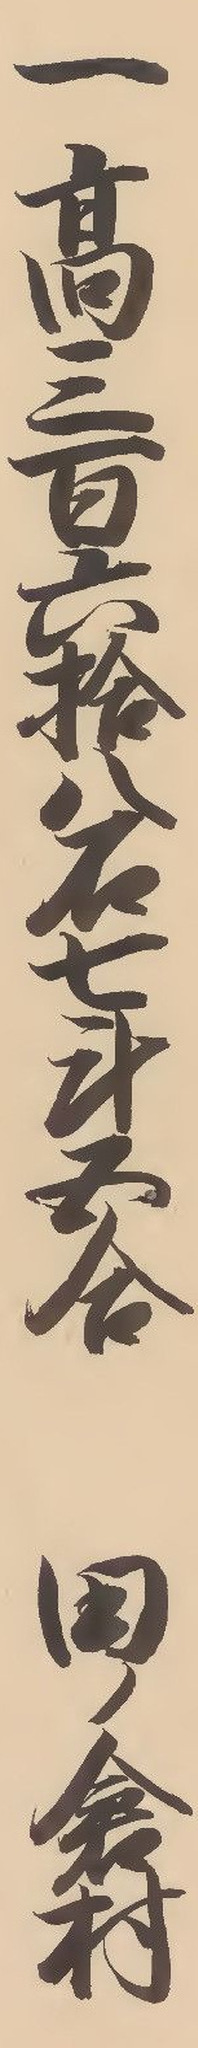一高三百六拾八石七斗五合田ノ倉村
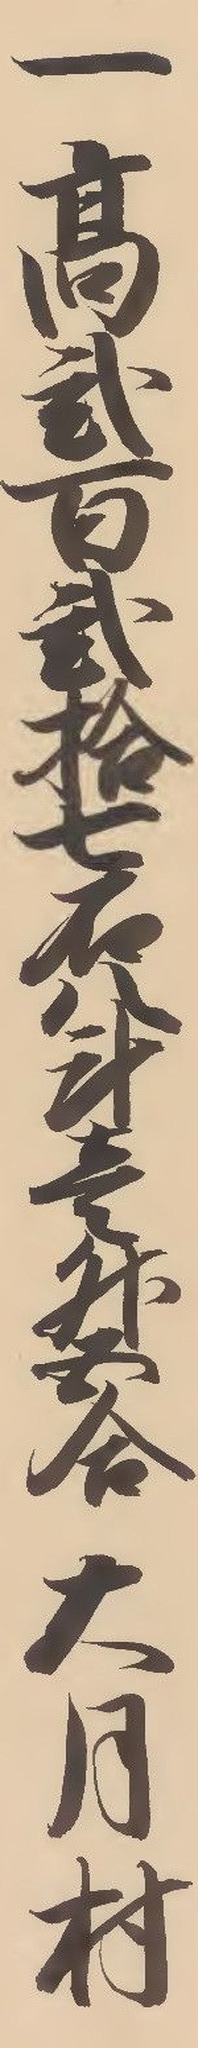一高弐百弐拾七石八斗壱升五合大月村
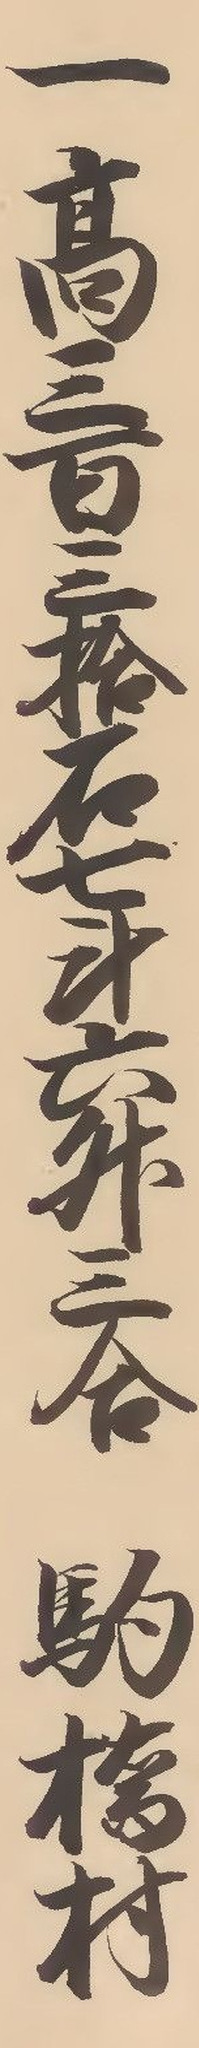一高三百三拾石七斗六升三合駒橋村
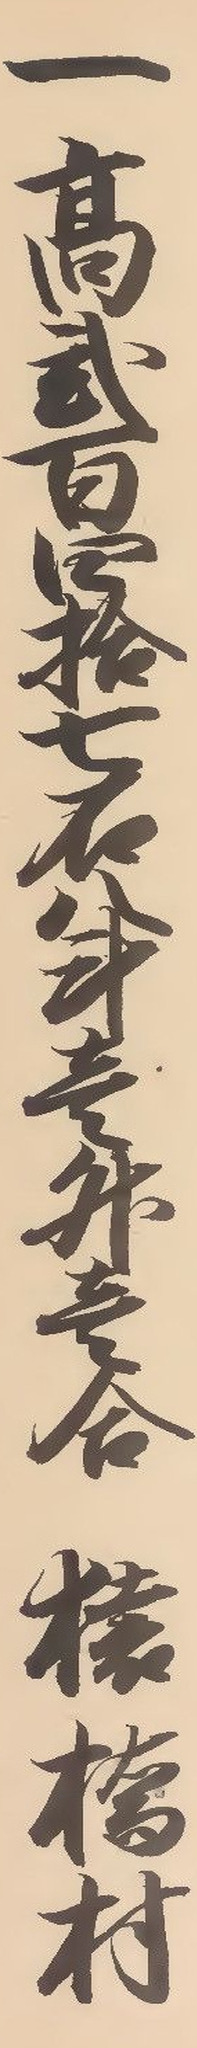一高弐百四拾七石八斗壱升壱合猿橋村
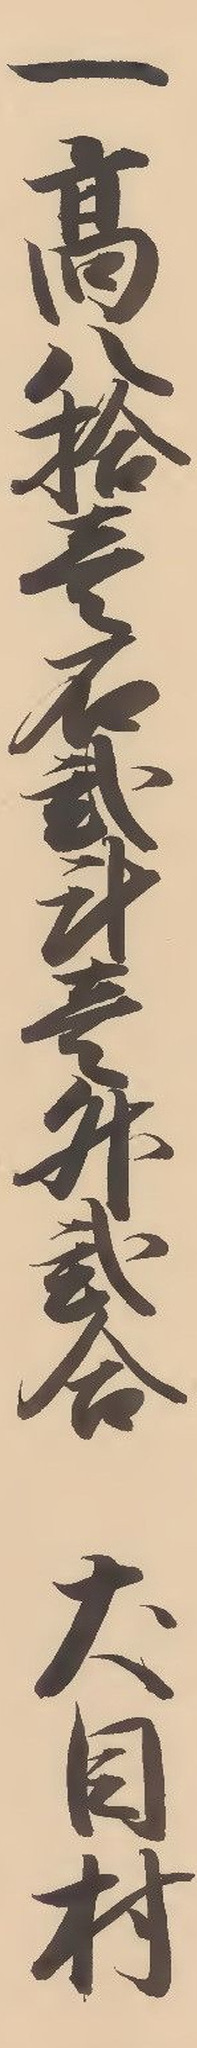一高八拾壱石弐斗壱升弐合犬目村
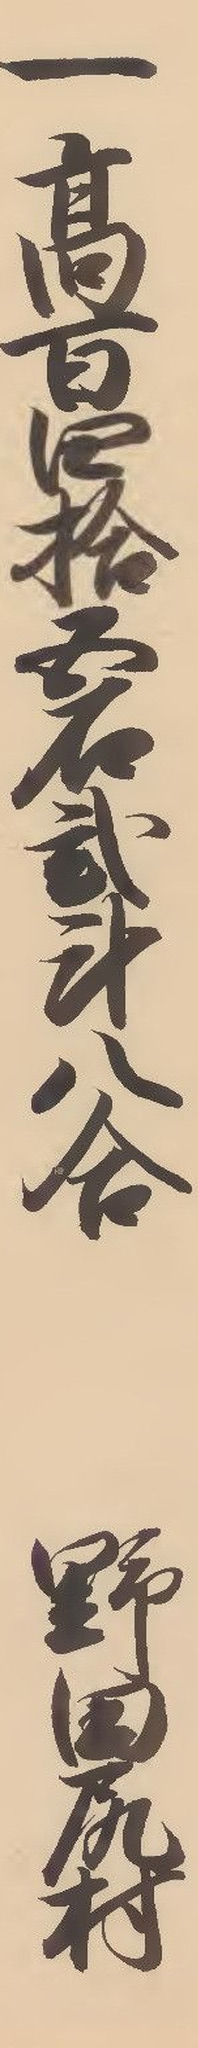一高百四拾五石弐斗八合野田尻村

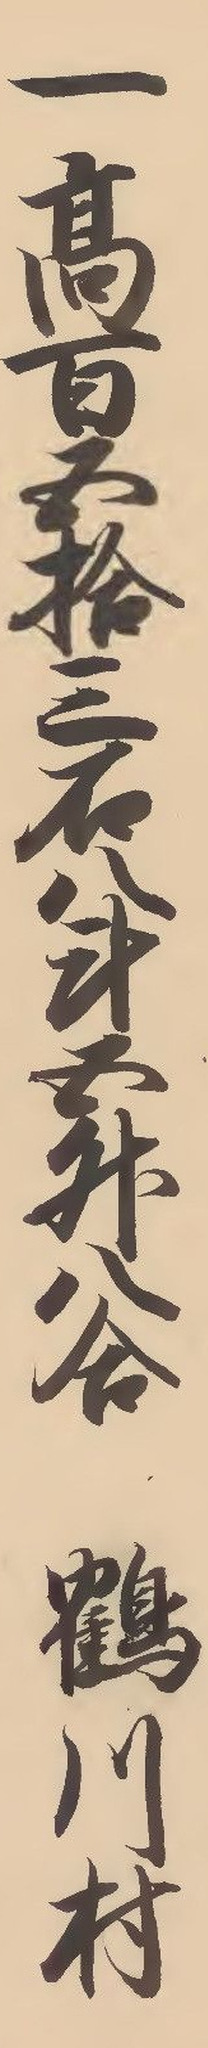一高百五拾三石八斗五升八合鶴川村
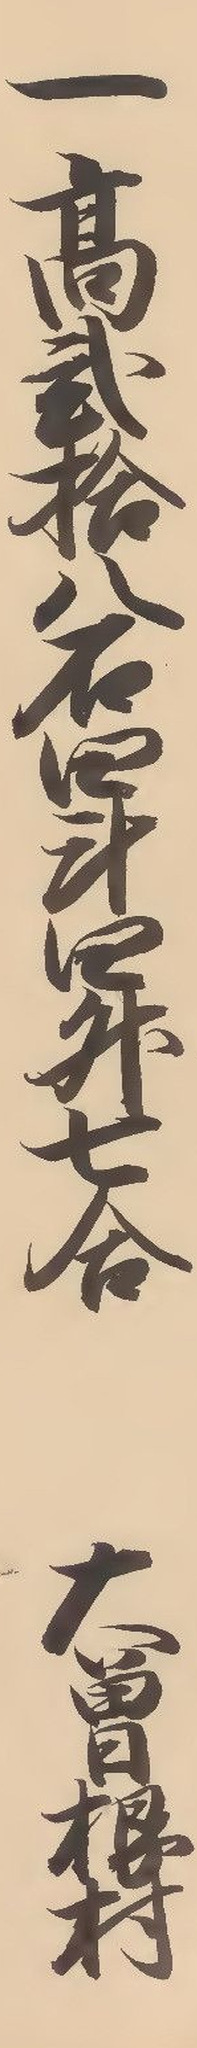一高弐拾八石四斗四升七合大曽根村
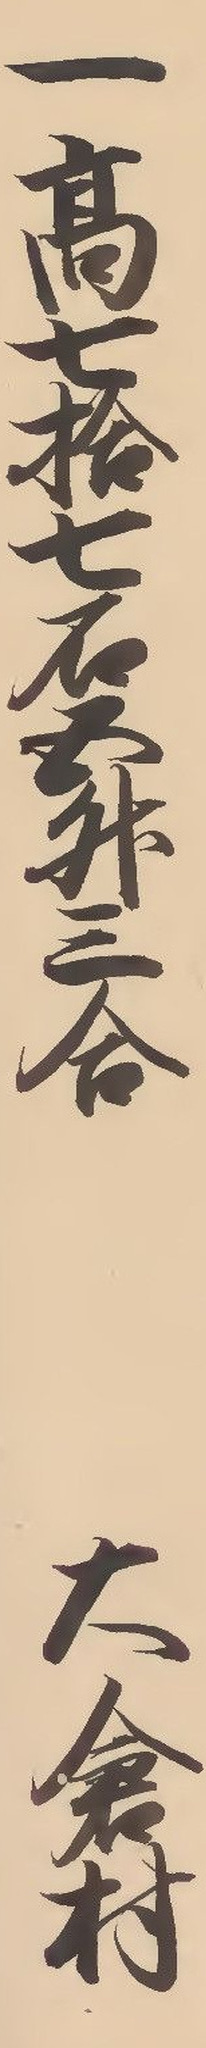一高七拾七石五升三合大倉村
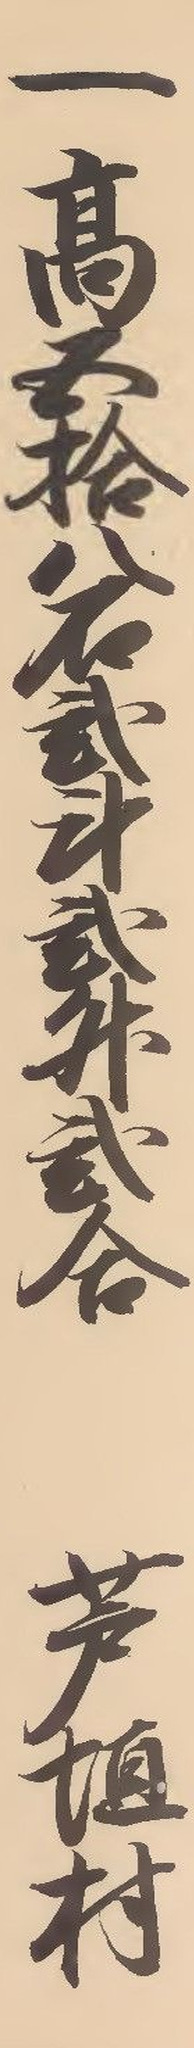一高五拾八石弐斗弐升弐合芦垣村
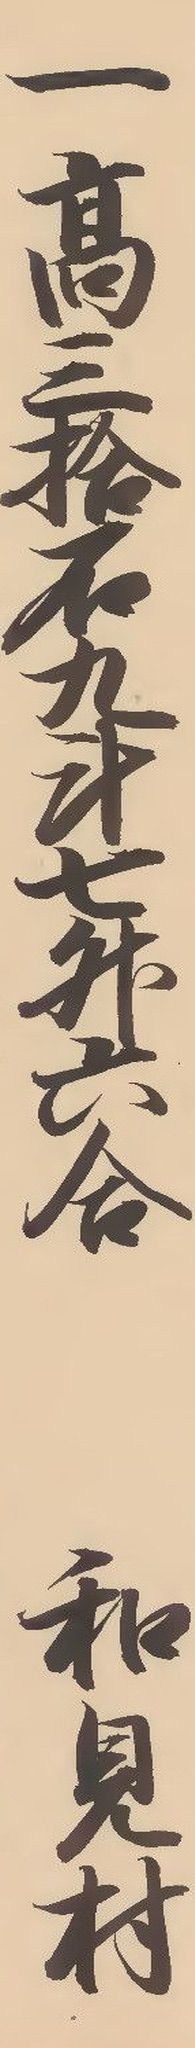一高三拾石九斗七升六合和見村

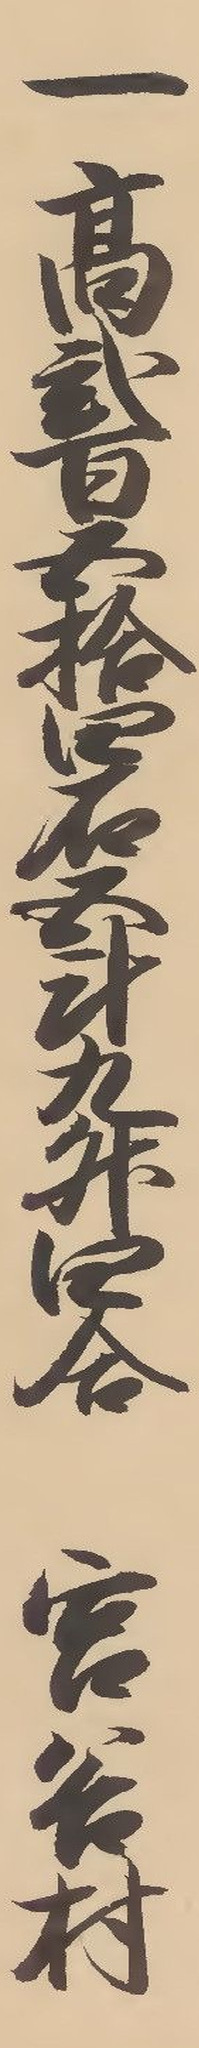一高弐百五拾四石五斗九升四合宮谷村
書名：甲斐国郷帳
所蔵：国立公文書館 National Archives of Japan
